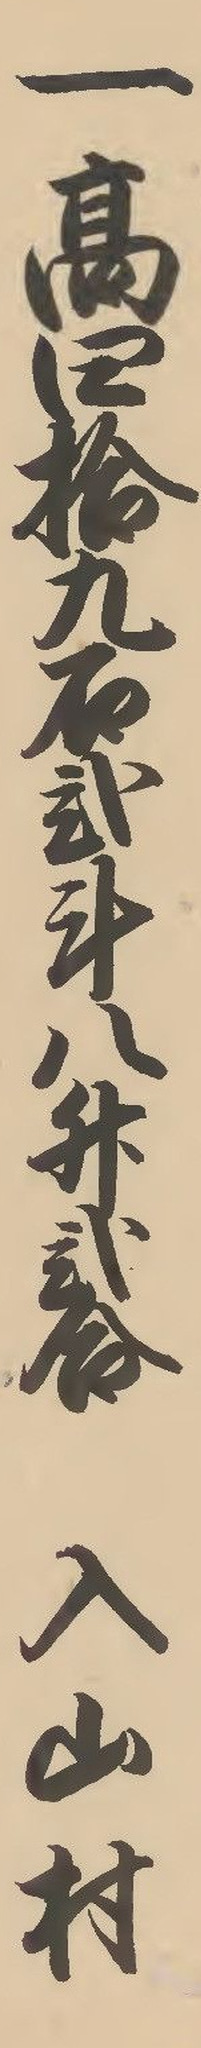一髙四拾九石弐斗八升弐合入山村
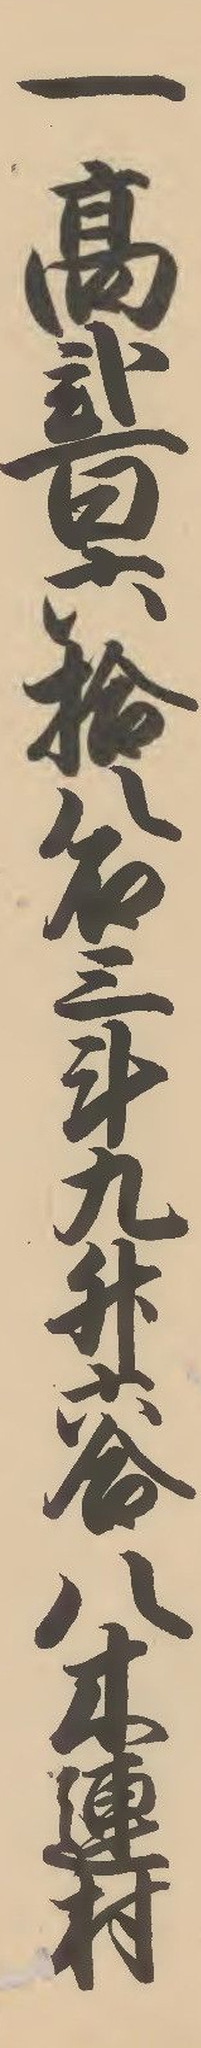一髙弐百六拾八石三斗九升六合八木連村
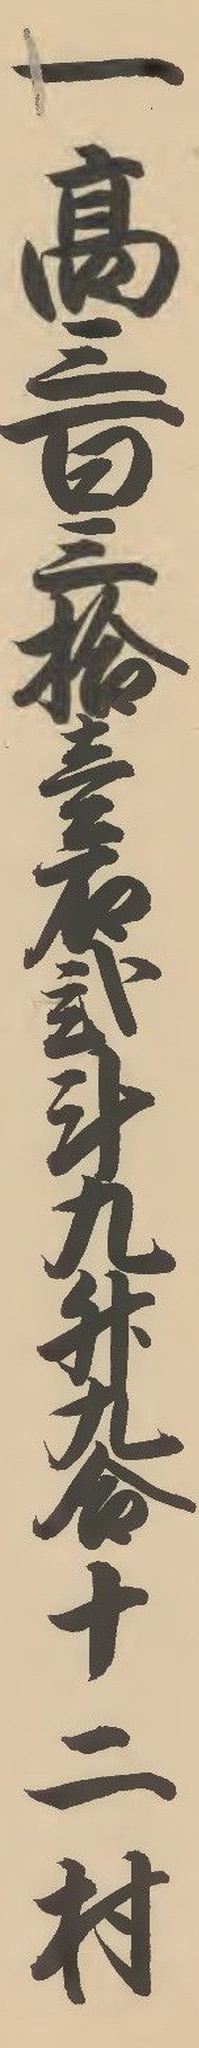一髙三百三拾壱石弐斗九升九合十二村
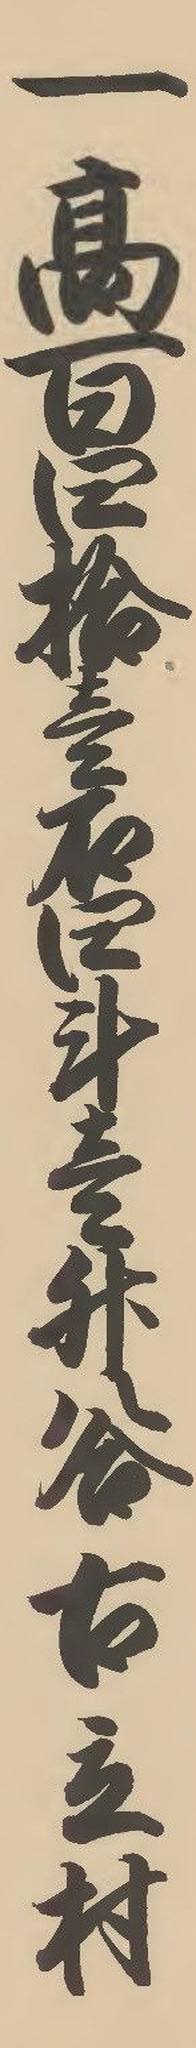一髙百四拾壱石四斗壱升八合古立村
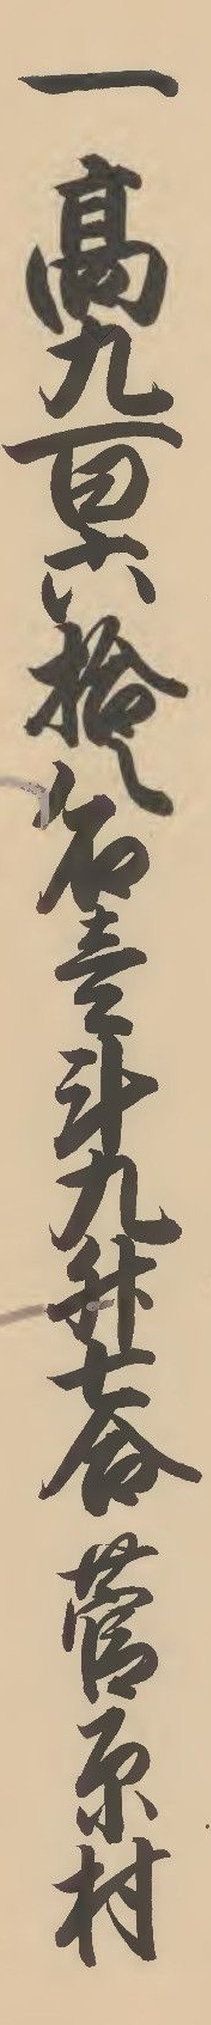一髙九百六拾八石壱斗九升七合菅原村

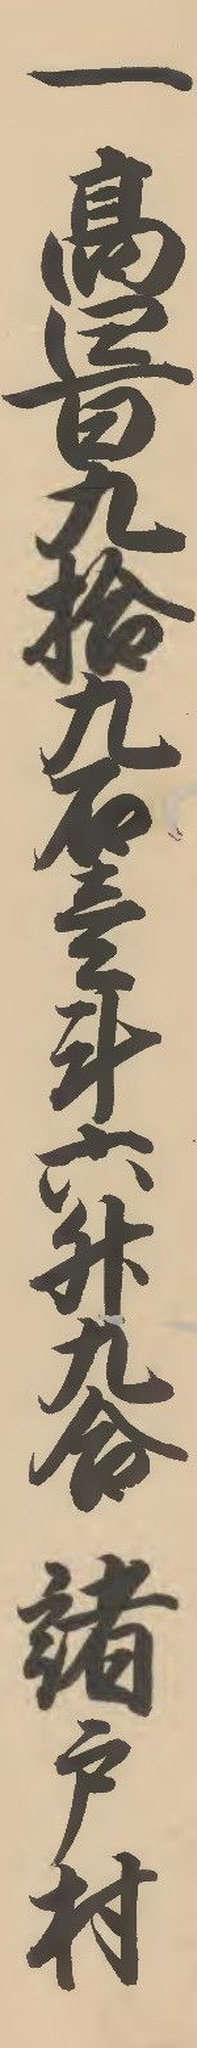一髙四百九拾九石壱斗六升九合諸戸村
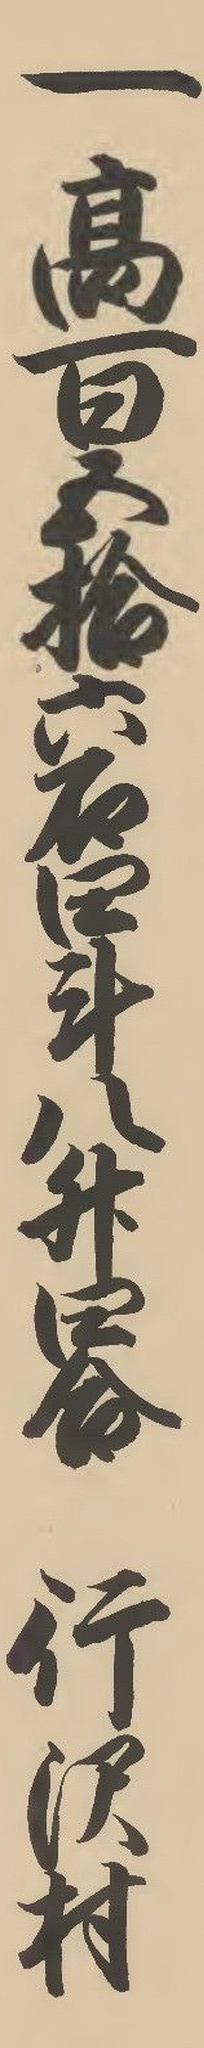一髙百五拾六石四斗八升四合行沢村
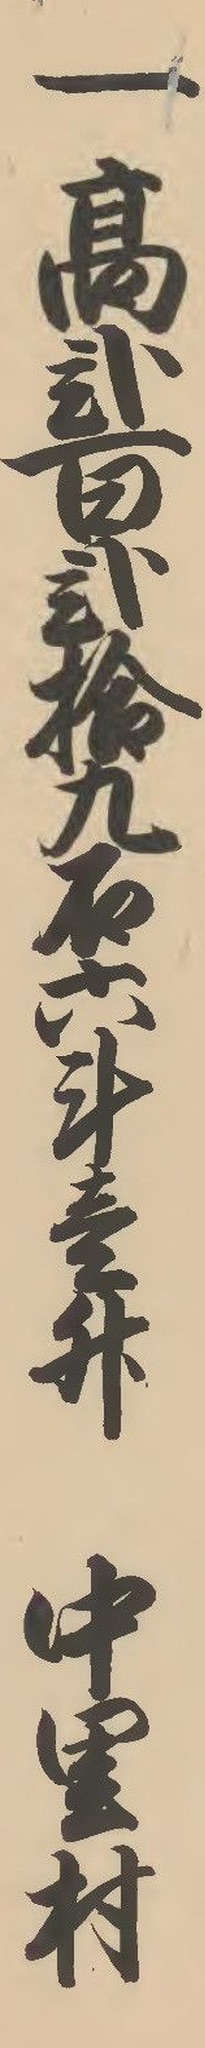一髙弐百弐拾九石六斗壱升中里村
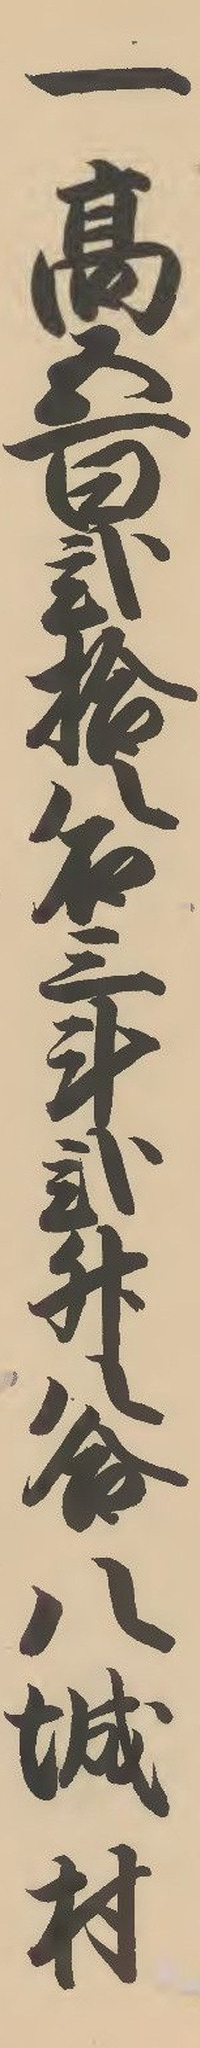一髙五百弐拾八石三斗弐升八合八城村
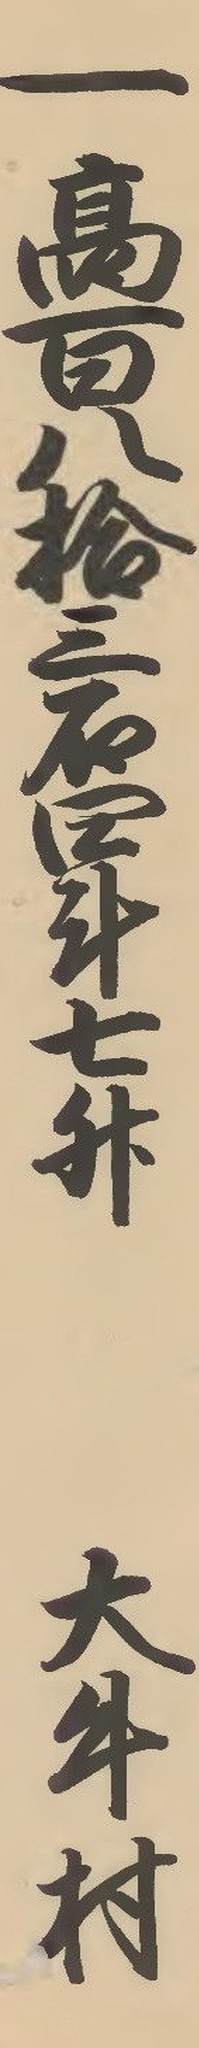一髙百八拾三石四斗七升大平村
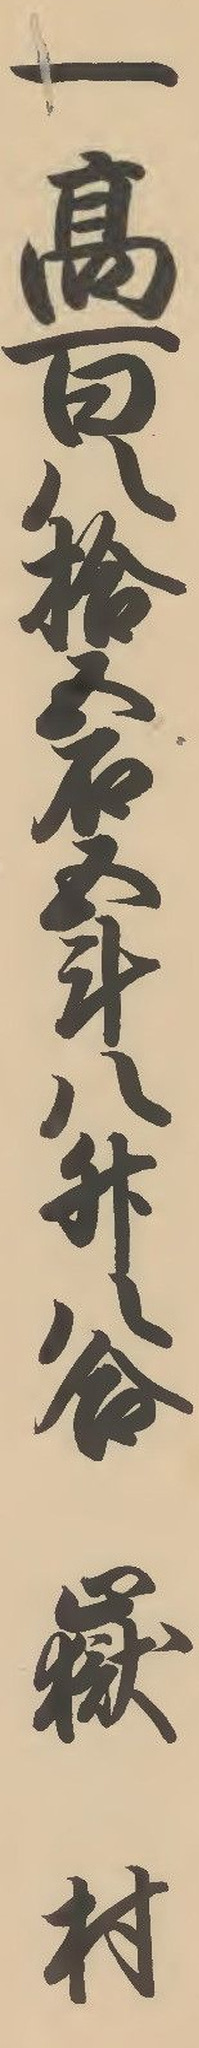一髙百八拾五石五斗八升八合嶽村
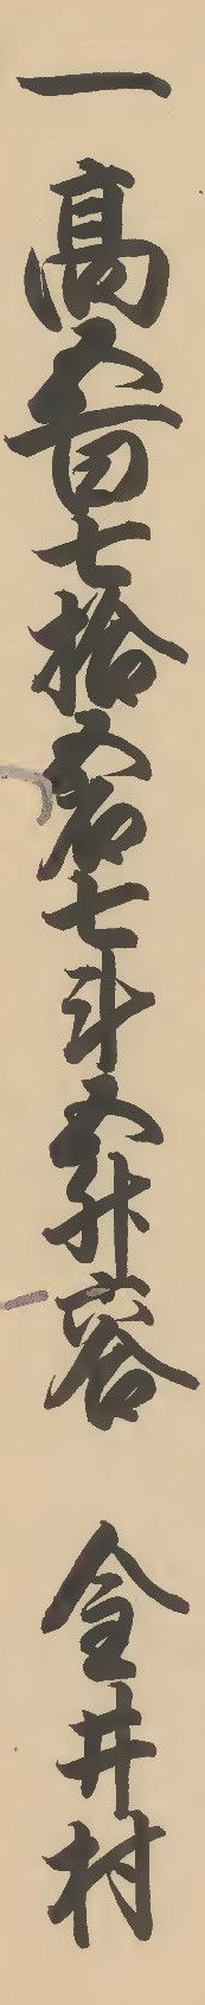一髙五百七拾五石七斗五升六合金井村

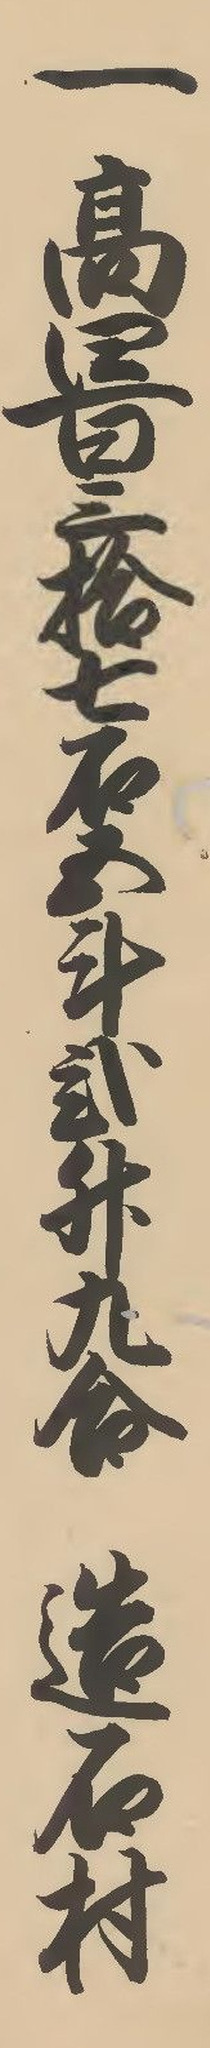一髙四百三拾七石五斗弐升九合造石村
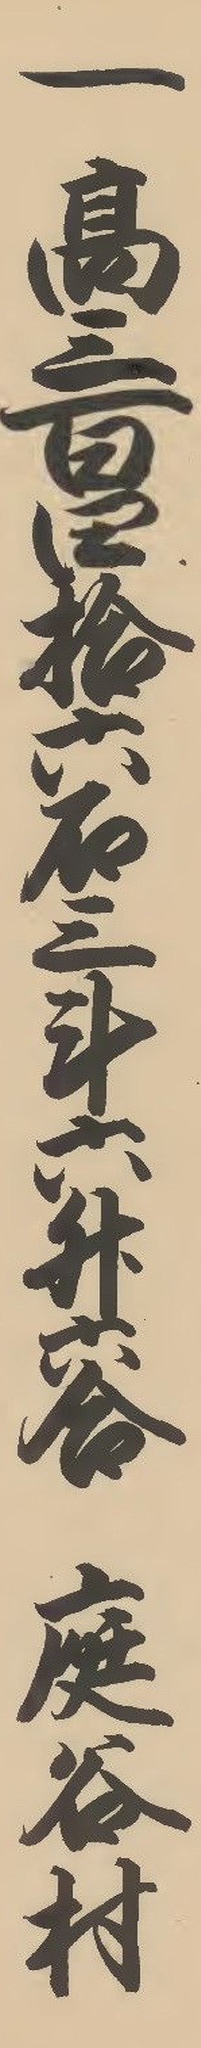一髙三百四拾六石三斗六升六合庭谷村
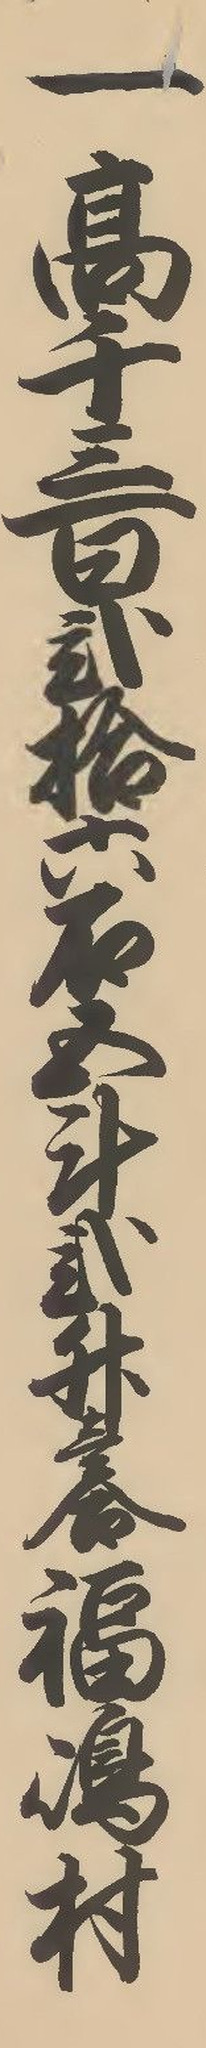一髙千三百弐拾六石五斗弐升壱合福嶋村
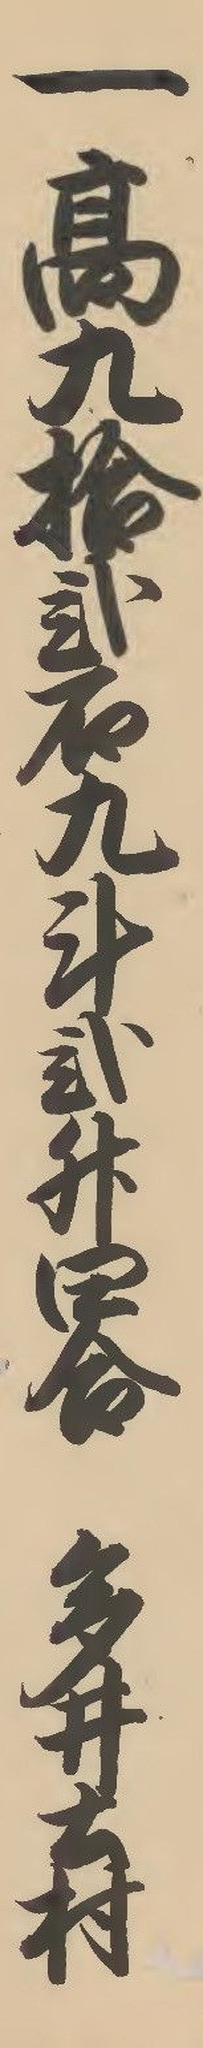一髙九拾弐石九斗弐升四合多井土村
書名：上野国郷帳
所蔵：国立公文書館 National Archives of Japan
